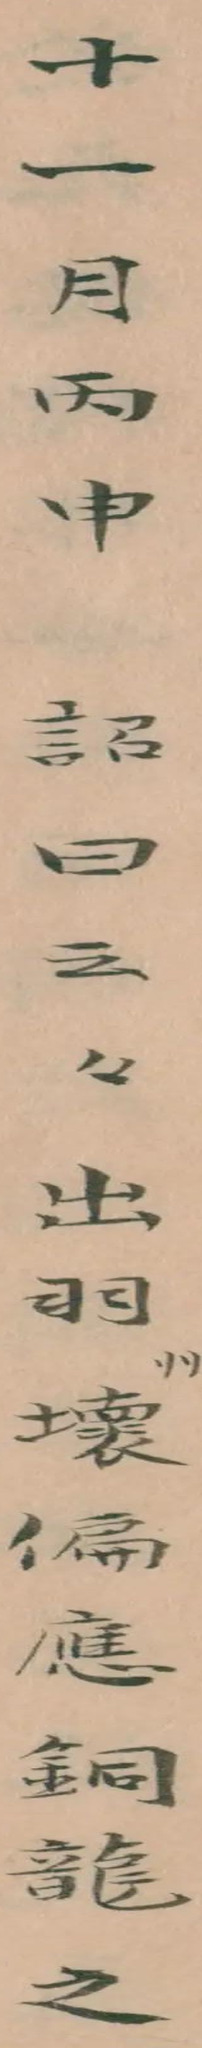十一月丙申詔曰云々出羽州壊偏応銅龍之
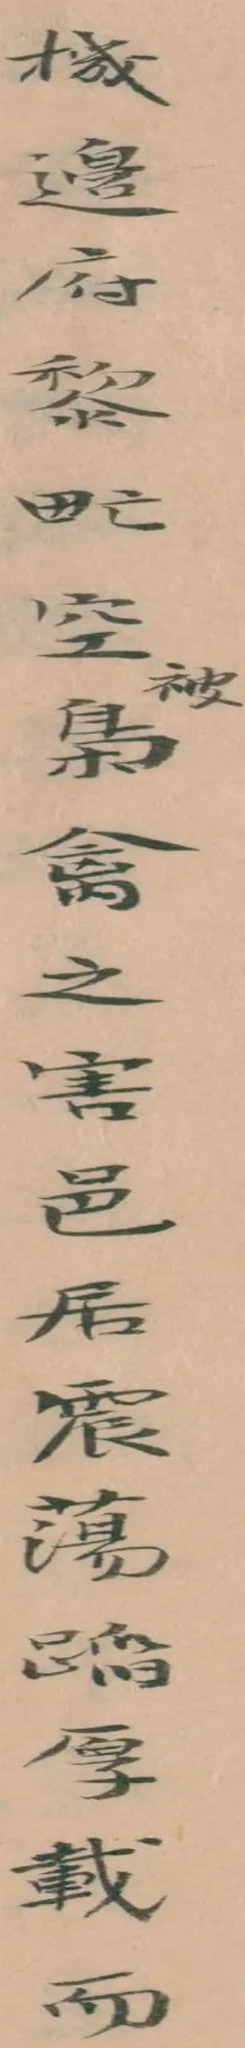撼辺府黎甿空被梟禽之害邑居震蕩蹈厚戴而

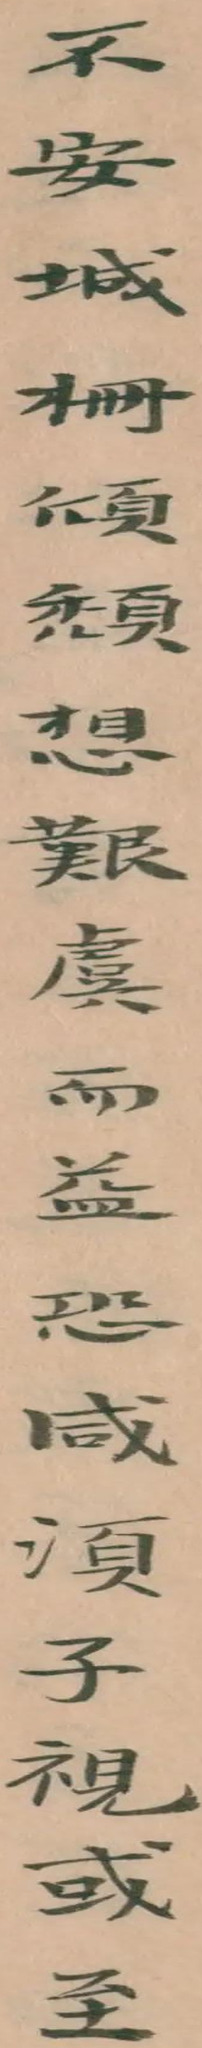不安城柵傾頽想艱虞而益恐咸湏子視或至
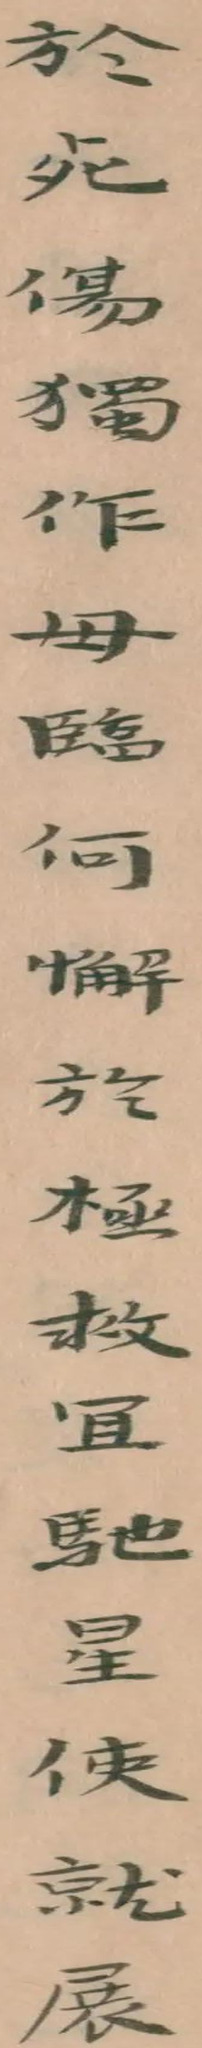於死傷独作母臨何懈於極救宜馳星使就展
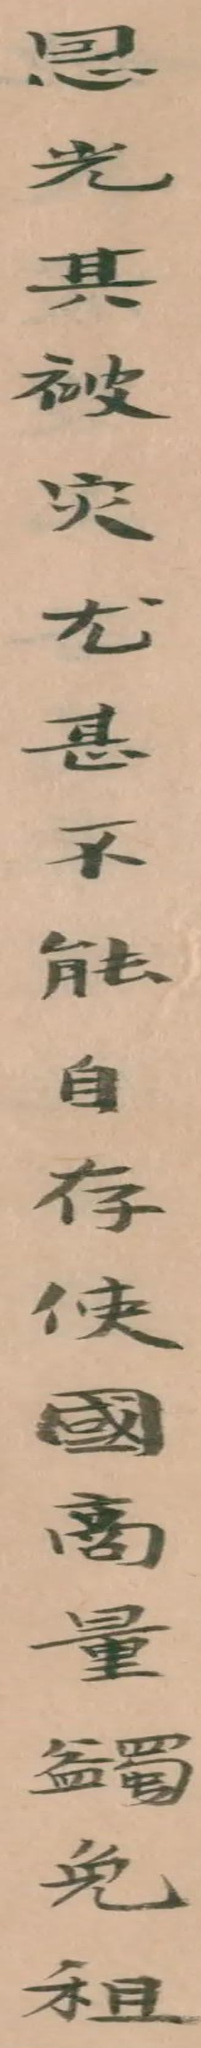恩光其被災尤甚不能自存使国商量蠲免租
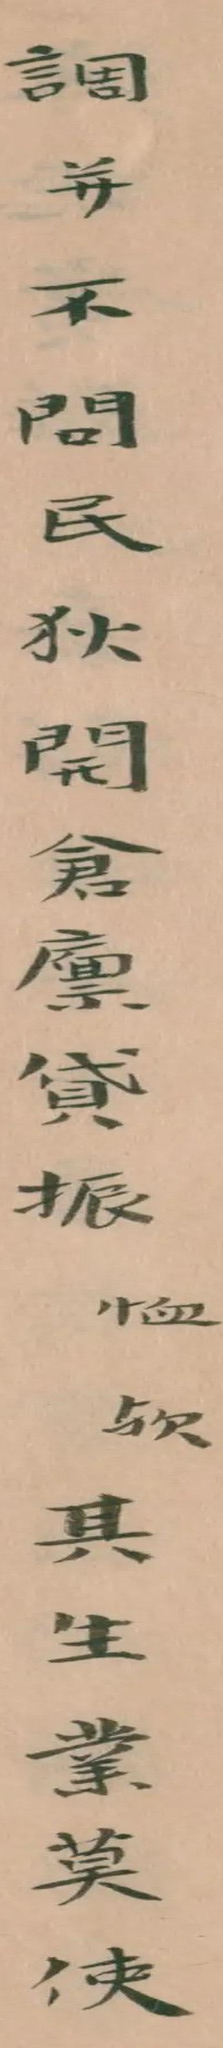調并不問民狄開倉廩貸振恤歟其生業莫使
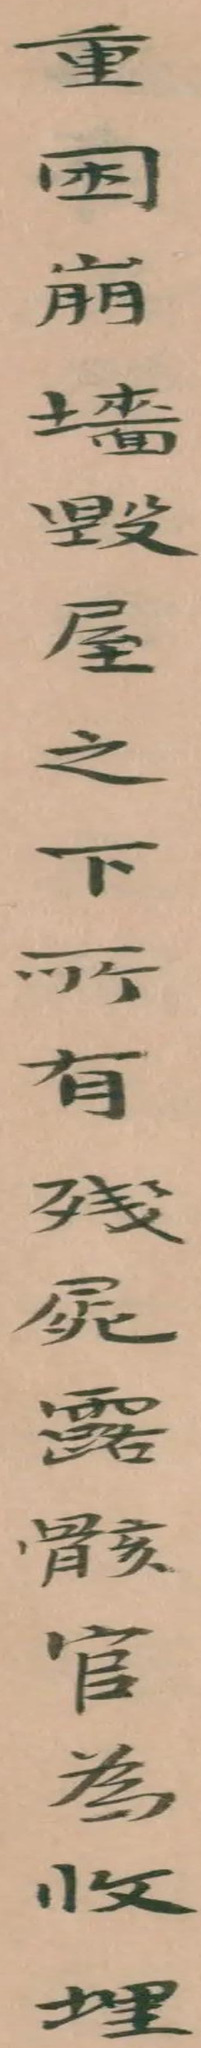重困崩墻毀屋之下所有残屍露骸官為収埋
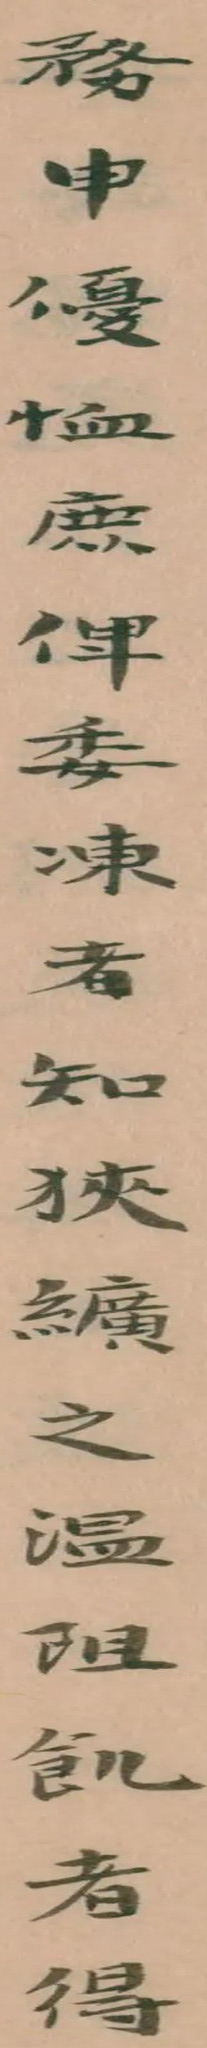務申優恤鹿俾委凍者知狭纊之温阻飢者得
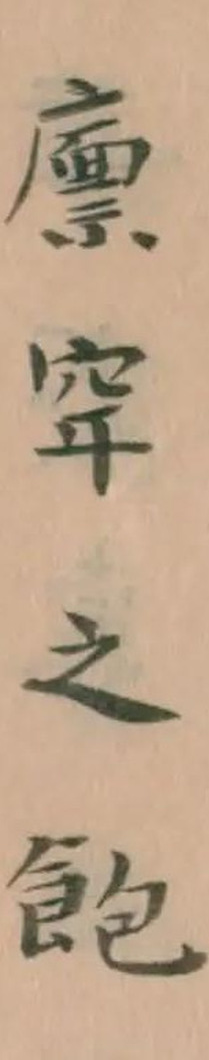廩穿之飽
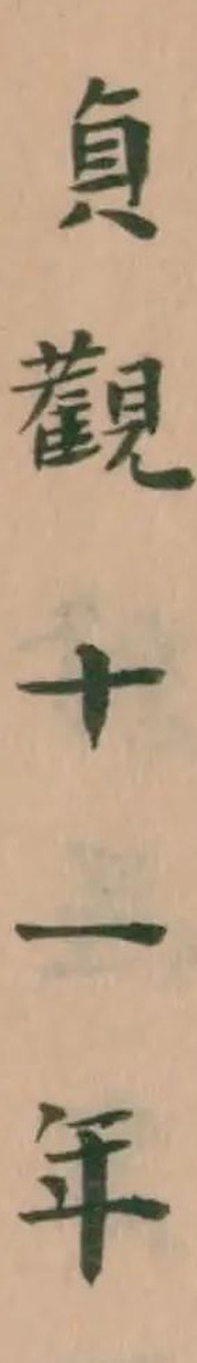貞観十一年
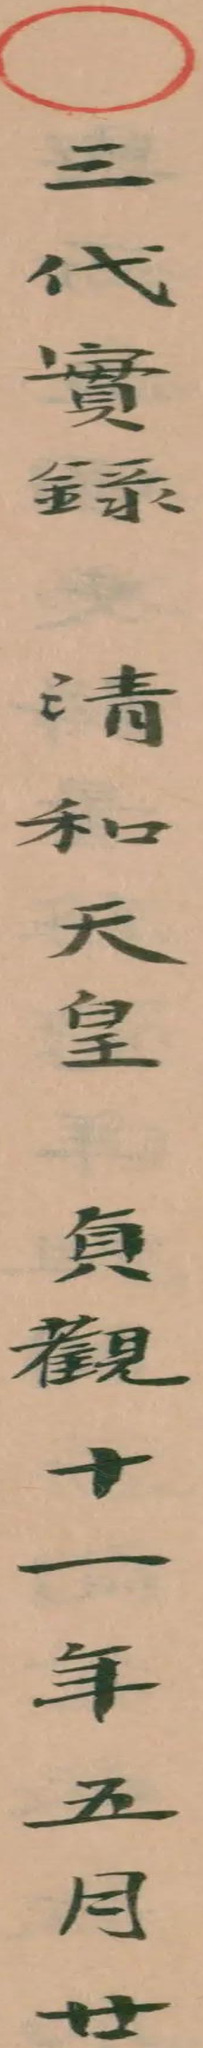〇三代実録清和天皇貞観十一年五月廿
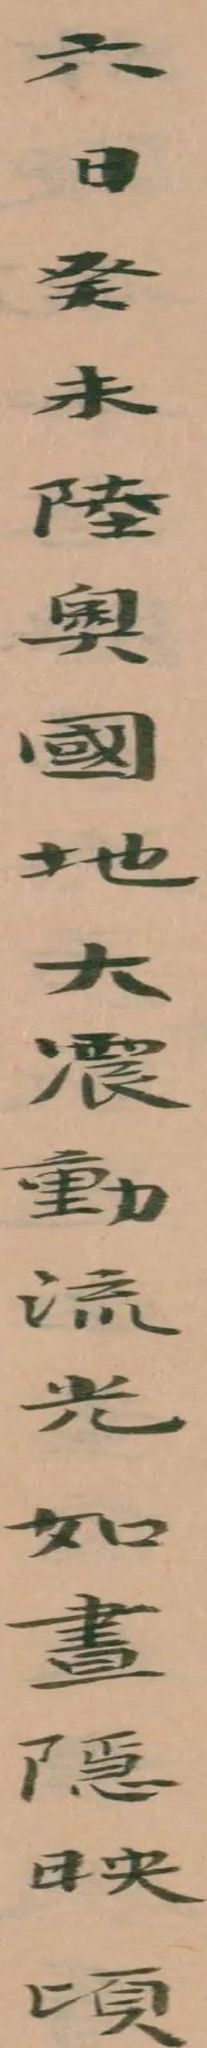六日癸未陸奥国地大震動流光如昼隠映頃
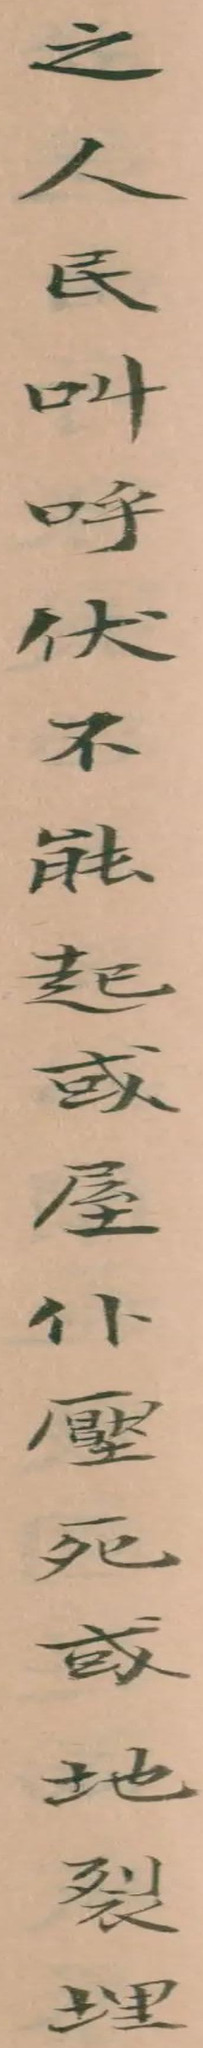之人民叫呼伏不能起或屋倒圧死或地裂埋
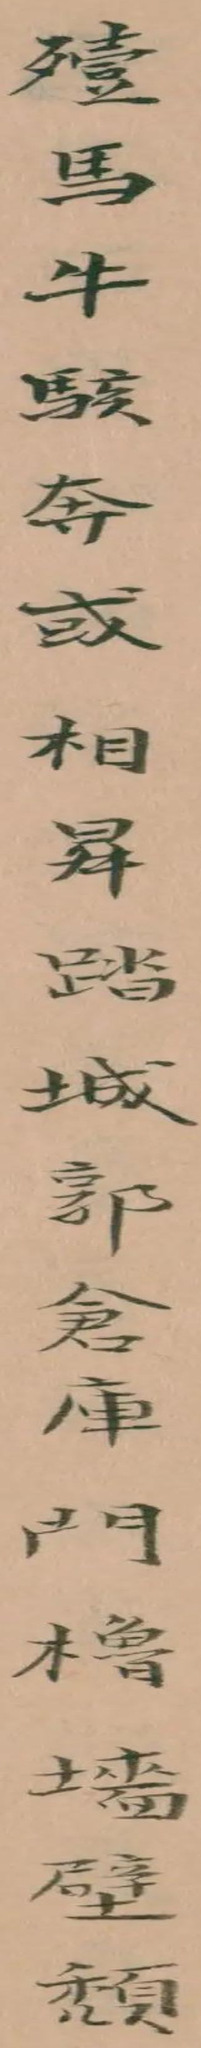殪馬牛駭奔或相昇踏城郭倉庫門櫓墻壁頽
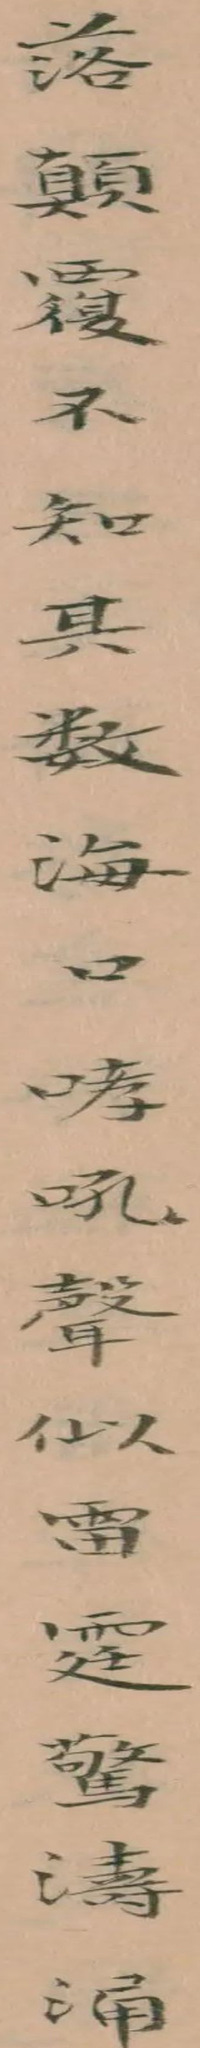落顛覆不知其数海口哮吼声以雷霆驚涛涌
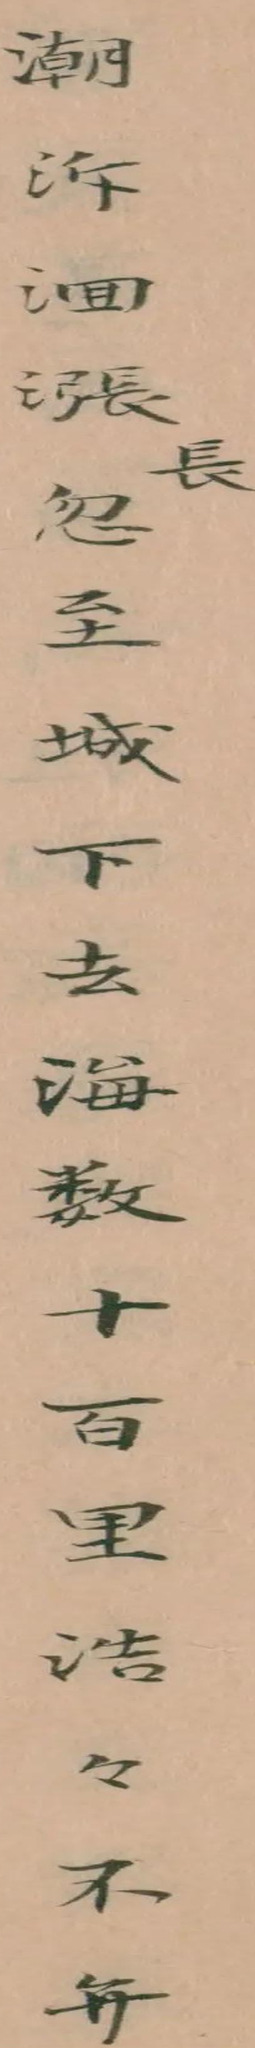潮泝洄漲長忽至城下去海数十百里浩々不弁
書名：地災撮要. 巻5-6(地震之部)
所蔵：国立国会図書館 National Diet Library, JAPAN
